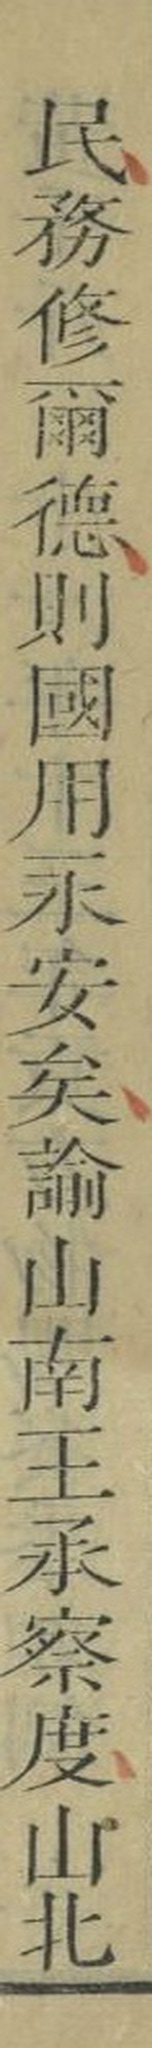民務修爾徳則国用永安矣諭山南王承察度山北
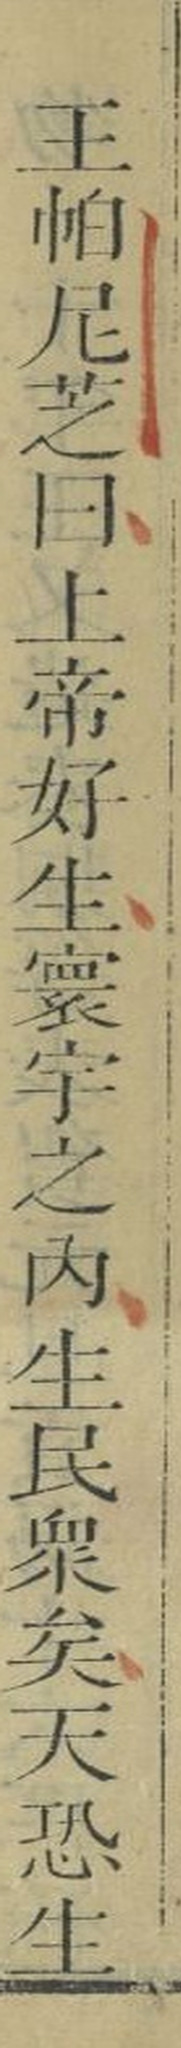王帕尼芝曰上帝好生寰宇之内生民衆矣天恐生
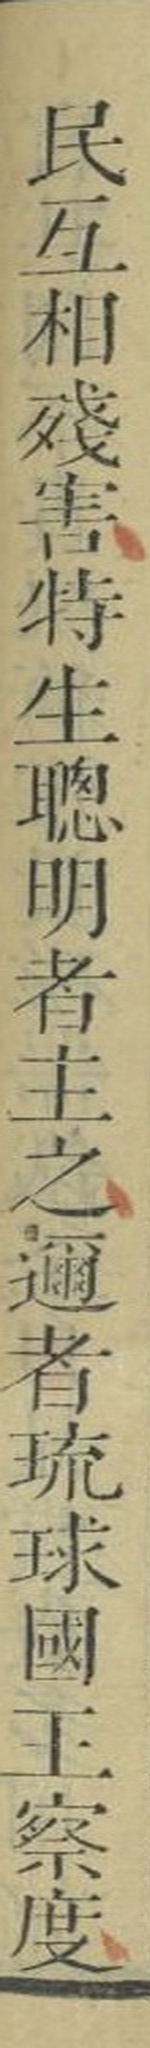民互相残害特生聡明者主之邇者琉球国王察度
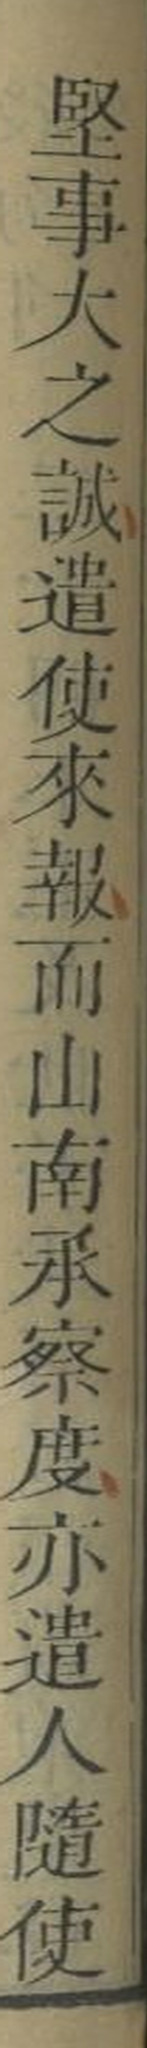堅事大之誠遣使来報而山南承察度亦遣人随使
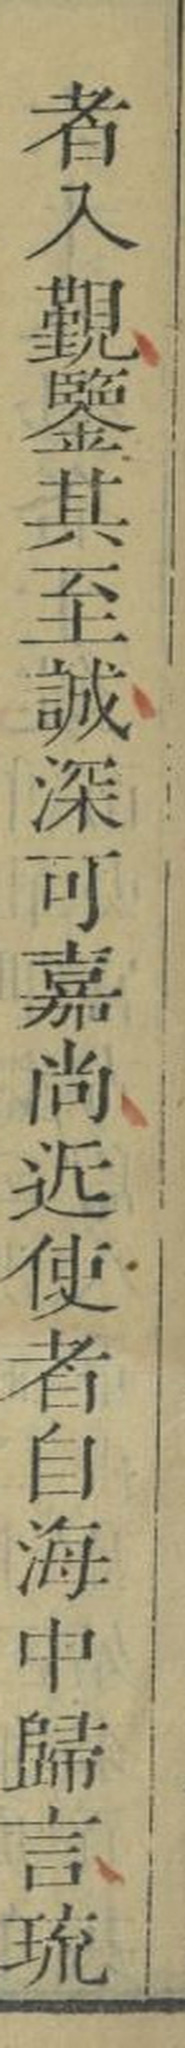者入覲鑑其至誠深可嘉尚近使者自海中帰言琉
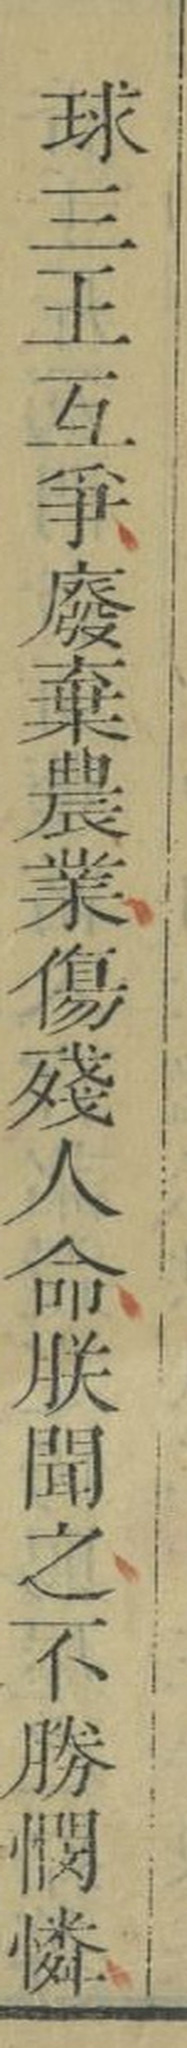球三王互争廃棄農業傷残人命朕聞之不勝憫憐
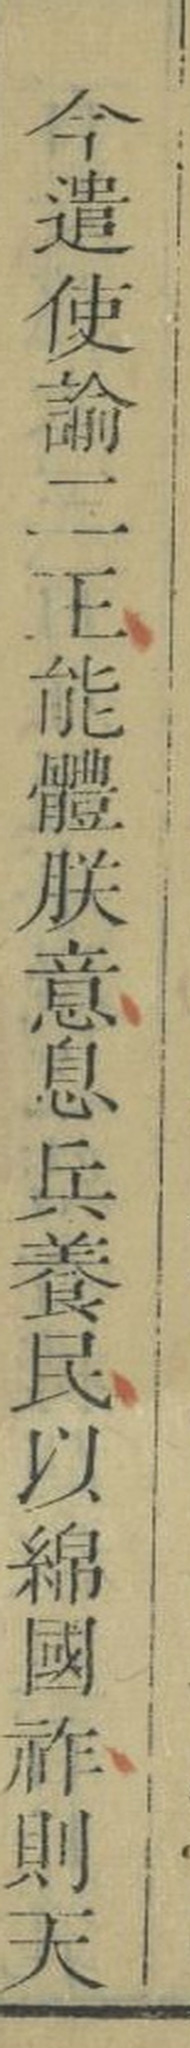今遣使諭二王能体朕意息兵養民以綿国祚則天
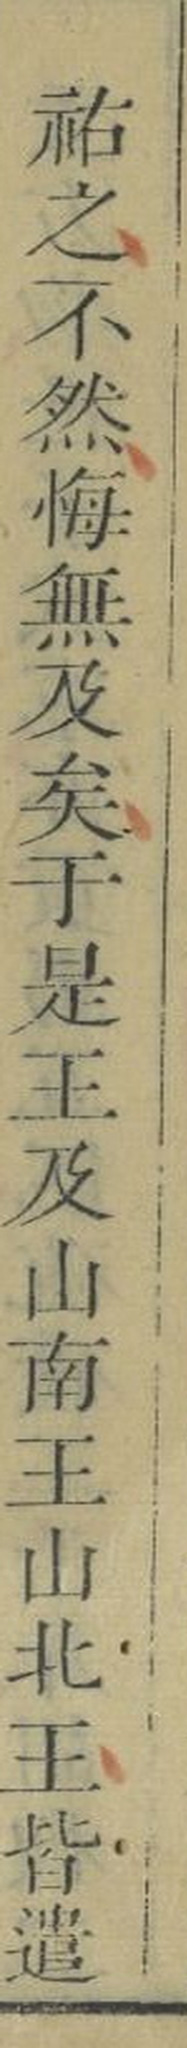祐之不然悔無及矣于是王及山南王山北王皆遣
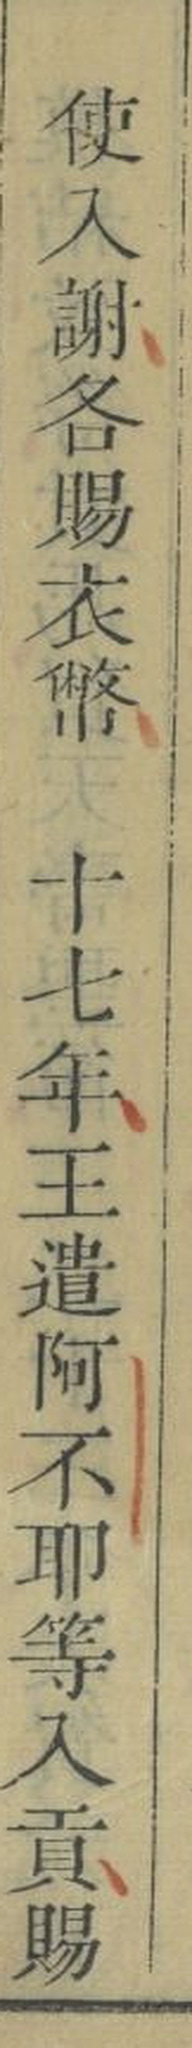使入謝各賜衣幣十七年王遣阿不耶等入貢賜
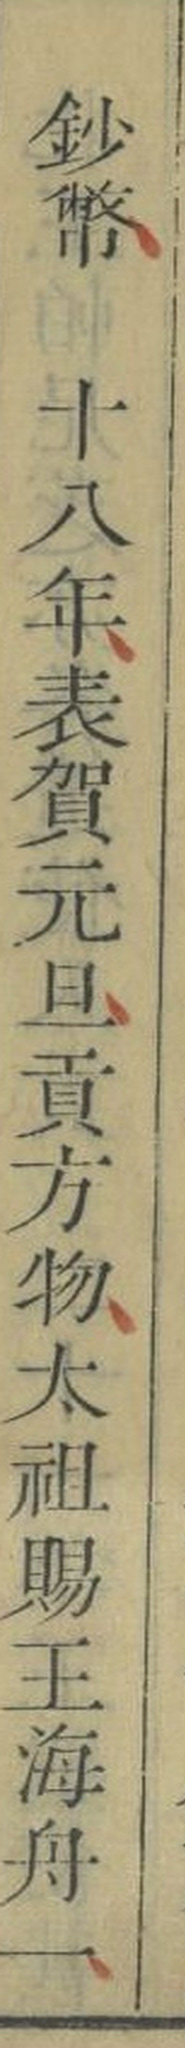鈔幣十八年表賀元旦貢方物太祖賜王海舟一
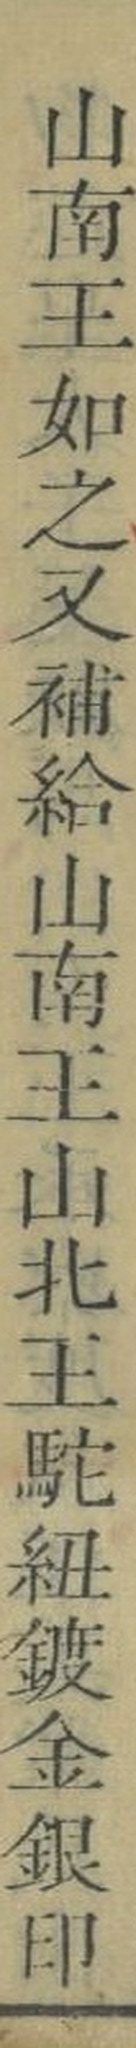山南王如之又補給山南王山北王駝紐鍍金銀印
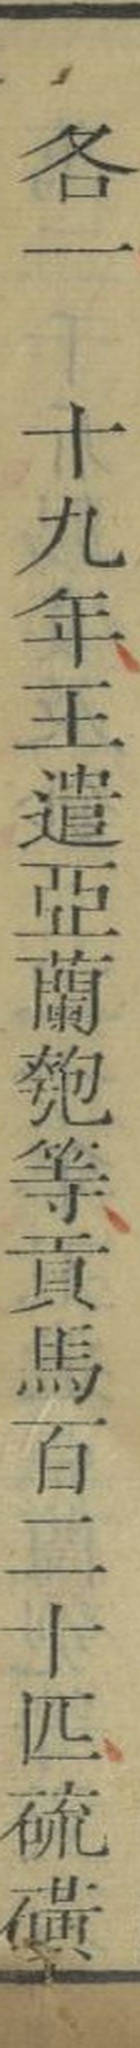各一十九年王遣亜蘭匏等貢馬百二十匹硫磺

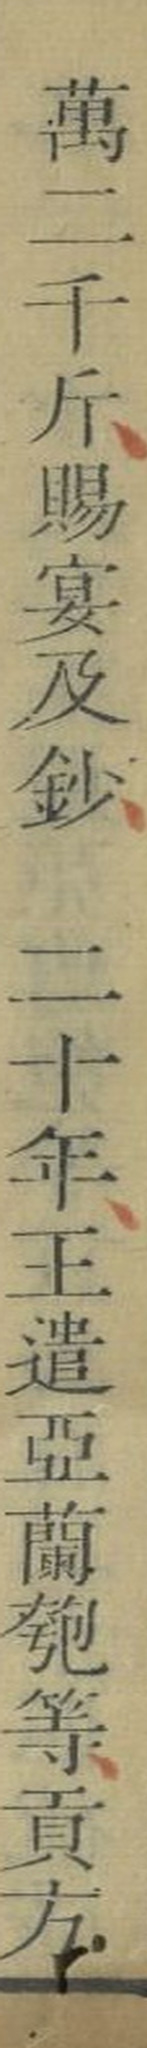万二千斤賜宴及鈔二十年王遣亜蘭匏等貢方
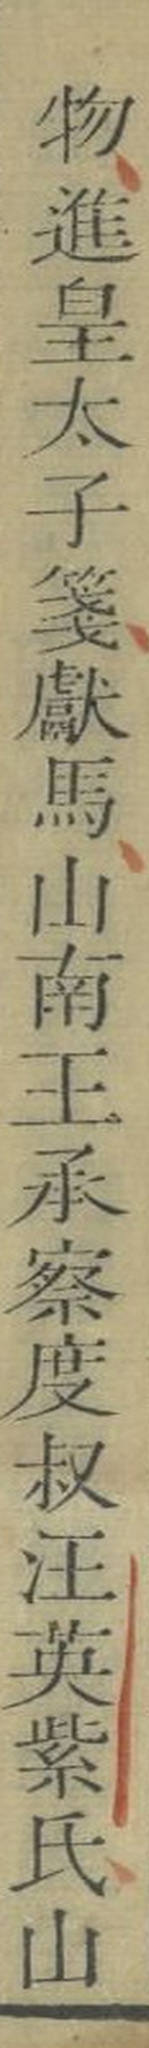物進皇太子箋献馬山南王承察度叔汪英紫氏山
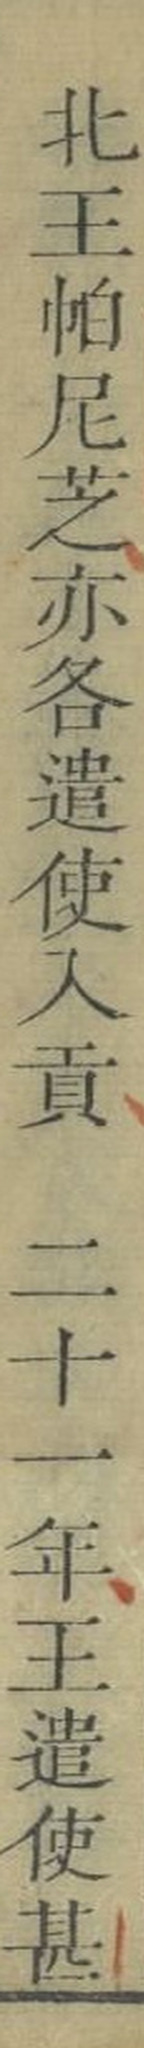北王帕尼芝亦各遣使入貢二十一年王遣使甚
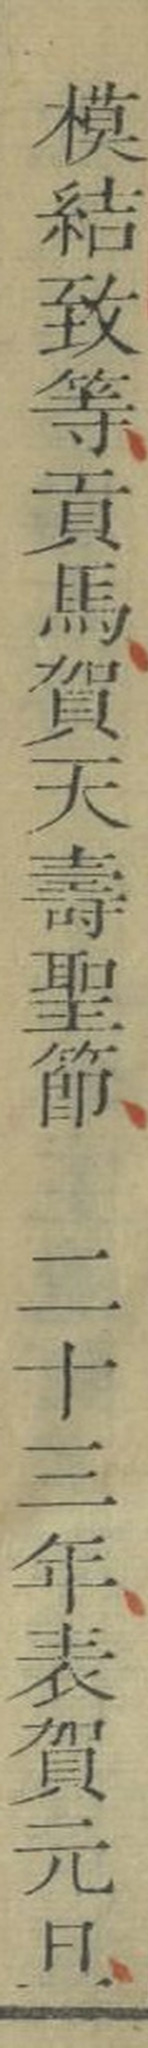模結致等貢馬賀天寿聖節二十三年表賀元旦
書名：中山伝信録 巻三
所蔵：University of the Ryukyus Library
